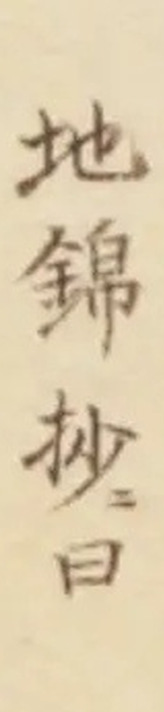地錦抄に曰
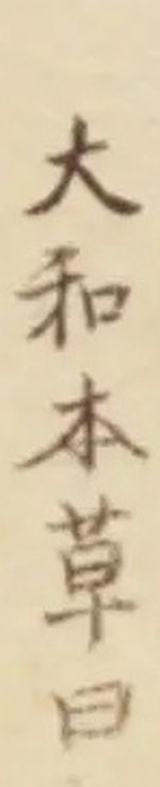大和本草曰
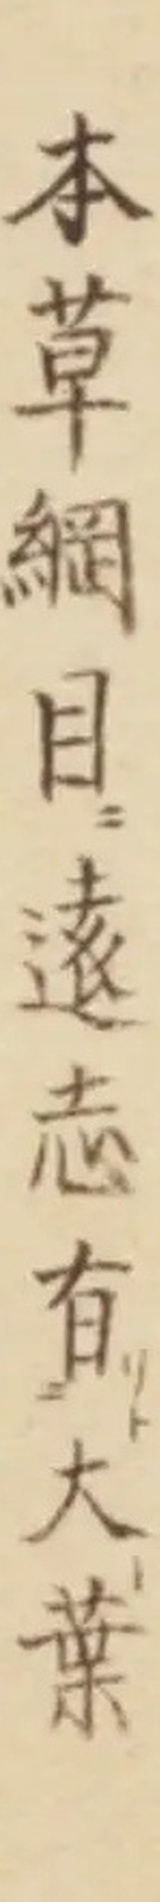本草綱目に遠志有りと大葉
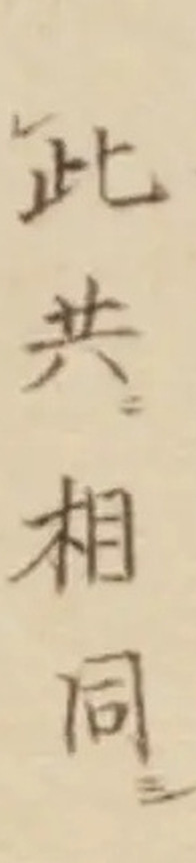此共に相同し

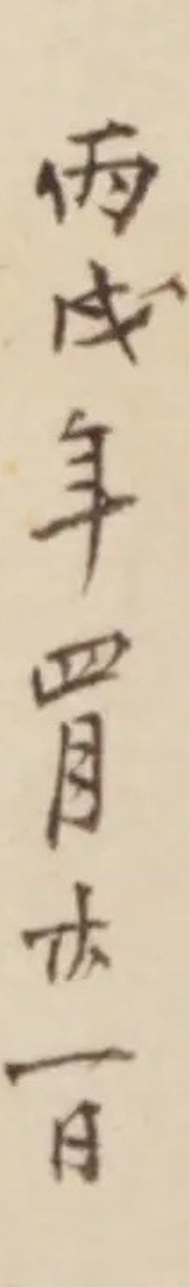丙戌四月廿一日
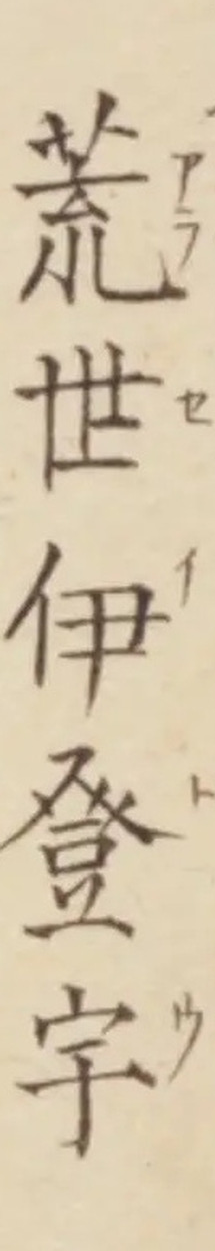荒世伊登宇
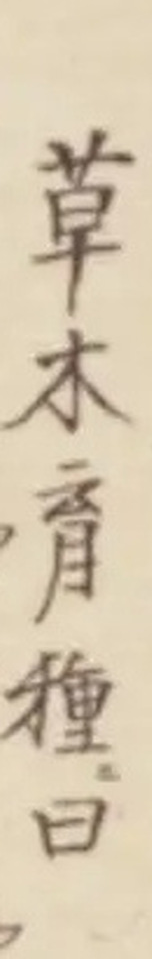草木育種に曰
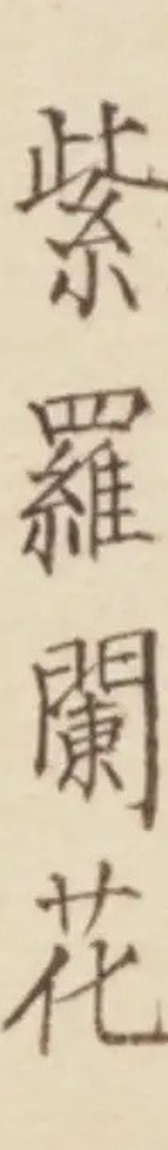紫羅闌花
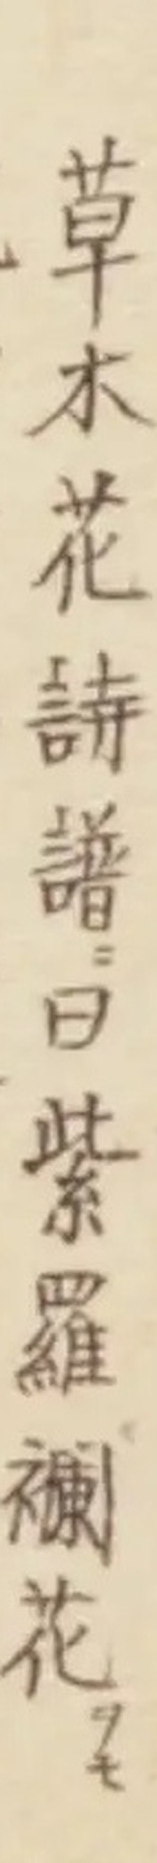草木花詩譜に曰紫羅闌花をも
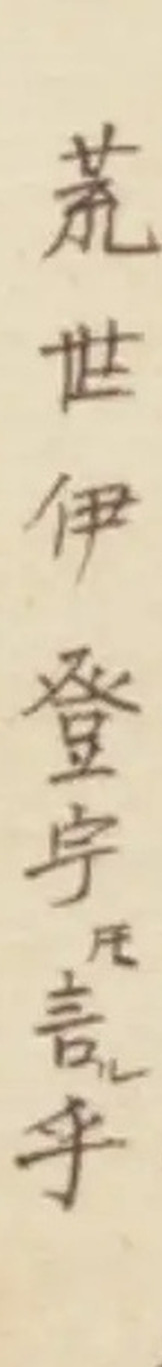荒世伊登宇
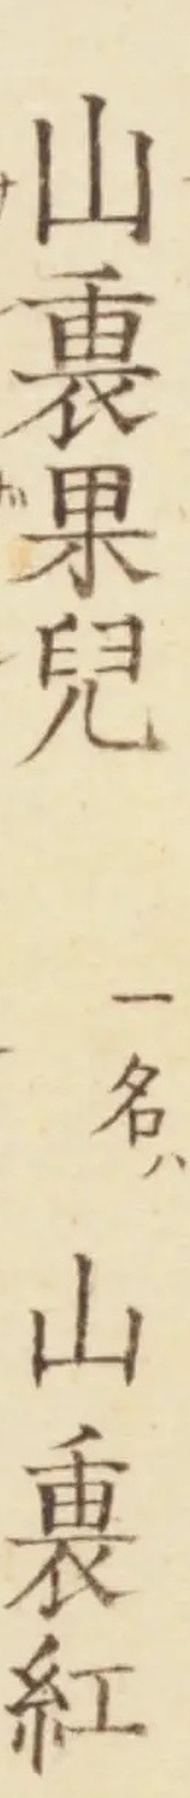山裏果兒一名は山裏紅
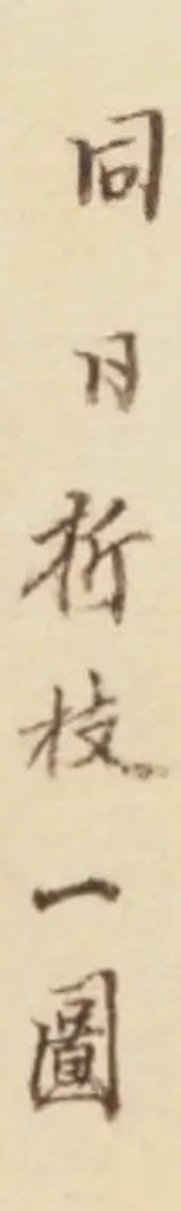同日折枝一圖
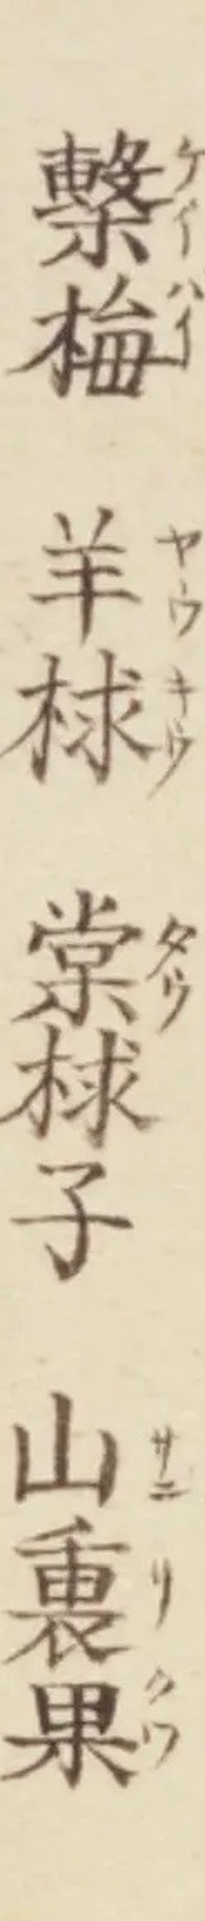繋梅羊梂棠梂子山裏果
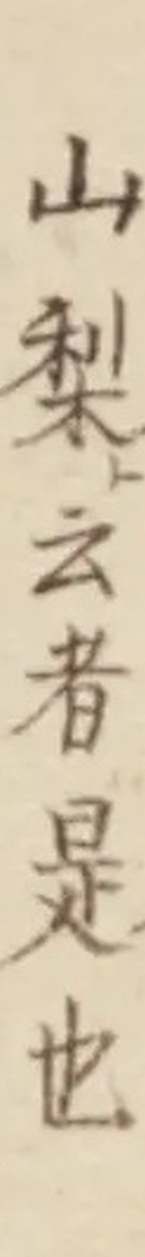山梨と云者は是也

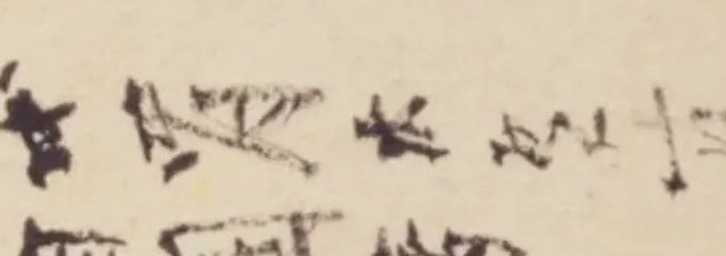戌四月廿有一日
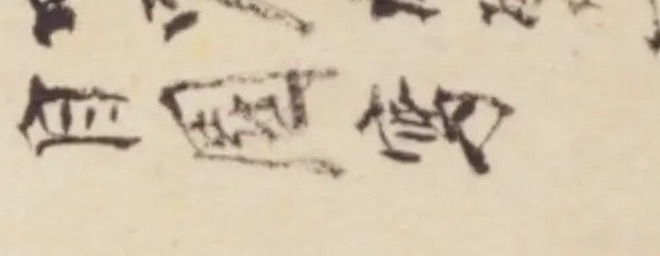自園寫
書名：梅園草木花譜夏之部. 3
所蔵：国立国会図書館 National Diet Library, JAPAN
